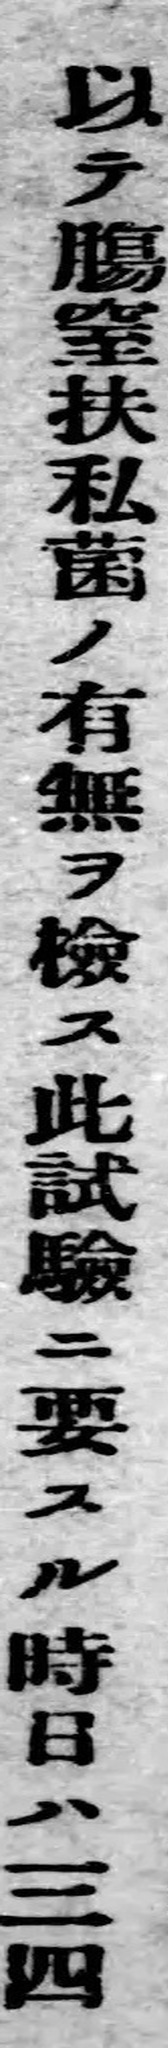以テ膓窒扶私菌ノ有無ヲ檢ス此試驗ニ要スル時日ハ三四
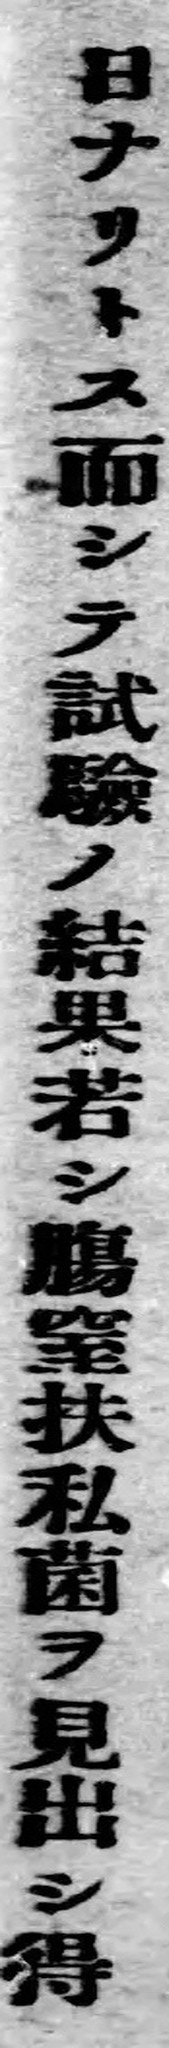日ナリトス而シテ試驗ノ結果若シ膓窒扶私菌ヲ見出シ得
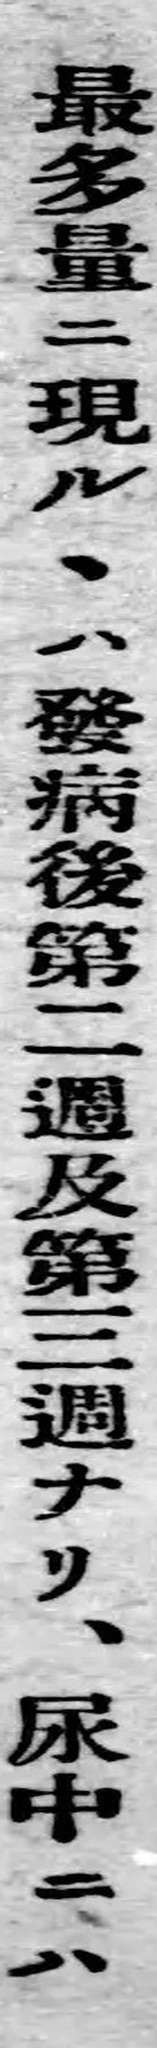最多量ニ現ルヽハ發病後第二週及第三週ナリ、尿中ニハ
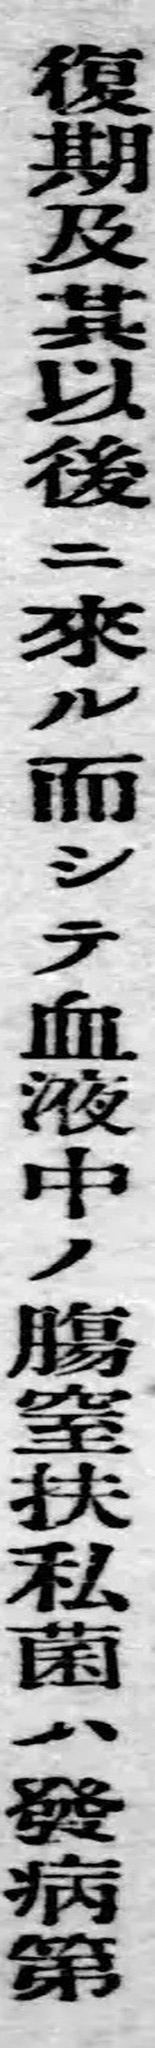復期及其以後ニ來ル而シテ血液中ノ膓窒扶私菌ハ發病第
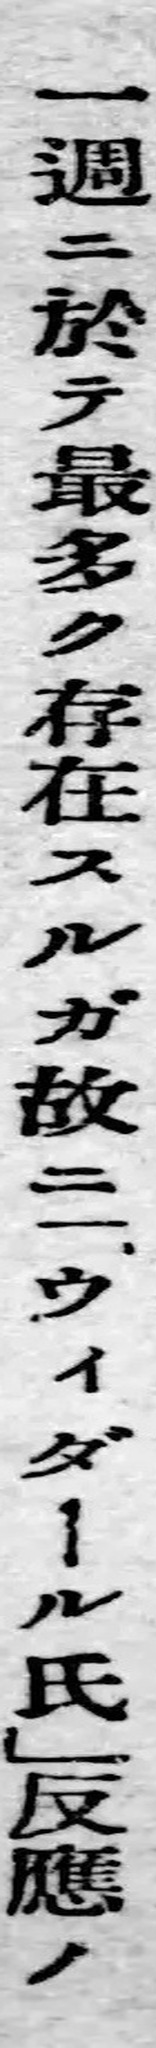一週ニ於テ最多ク存在スルガ故ニ「ウィダール氏」反應ノ
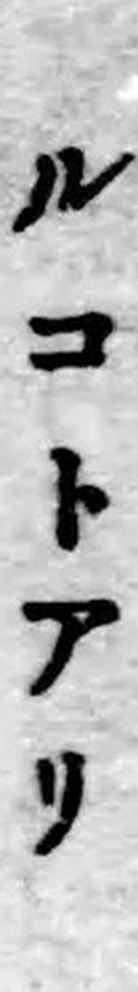ルコトアリ
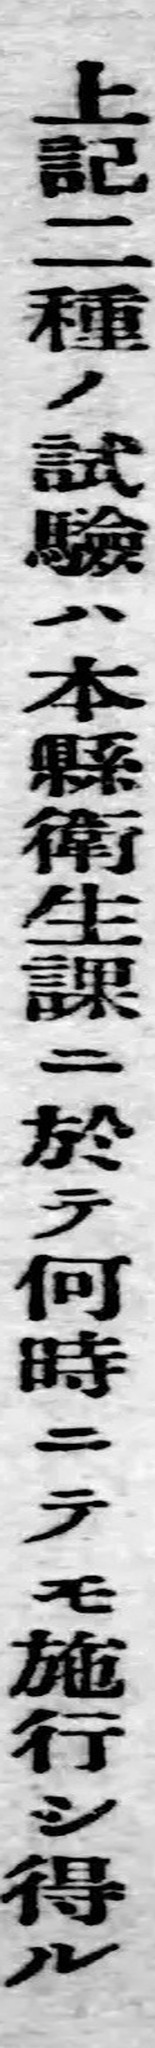上記二種ノ試驗ハ本縣衛生課ニ於テ何時ニテモ施行シ得ル

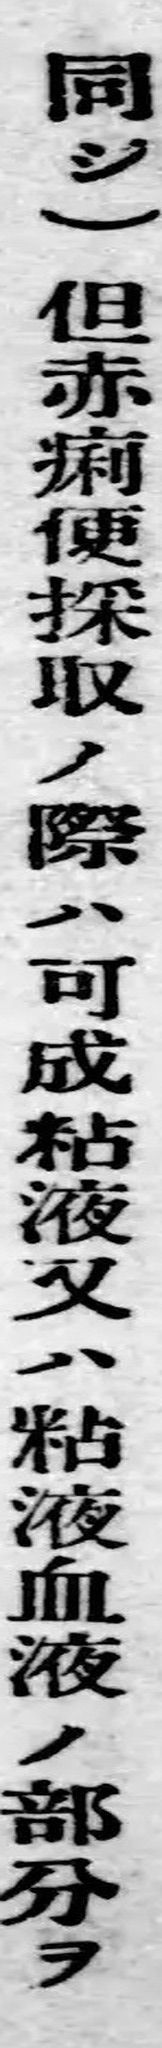同ジ)但赤痢便採取ノ際ハ可成粘液又ハ粘液血液ノ部分ヲ
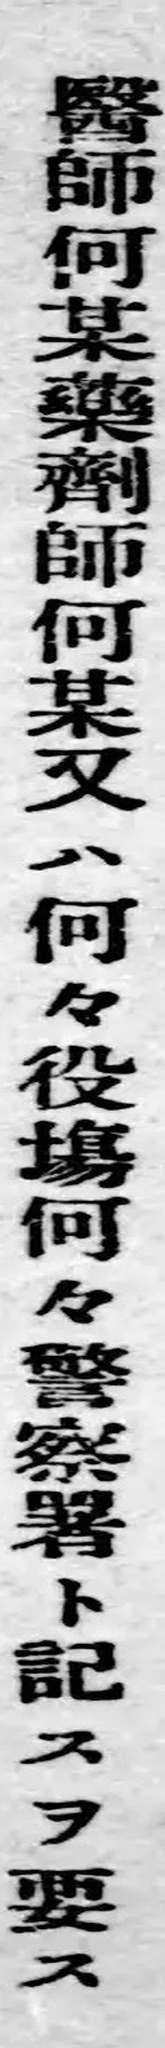醫師何某藥剤師何某又ハ何々役塲何々警察署ト記スヲ要ス
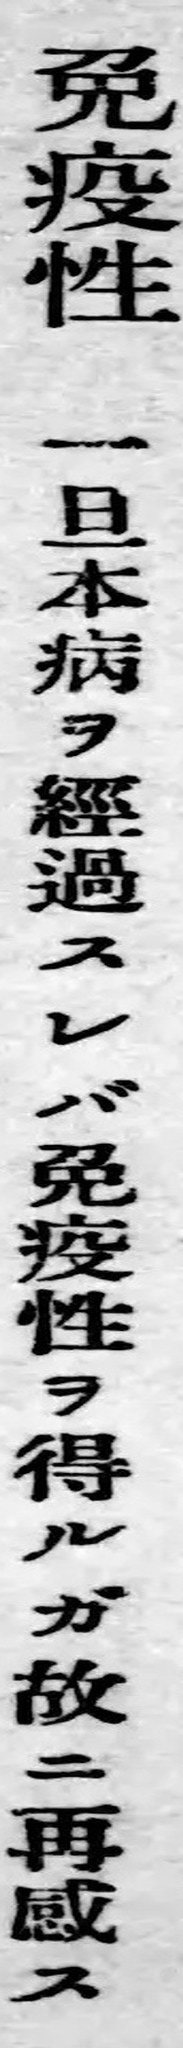免疫性一旦本病ヲ經過スレバ免疫性ヲ得ルガ故ニ再感ス
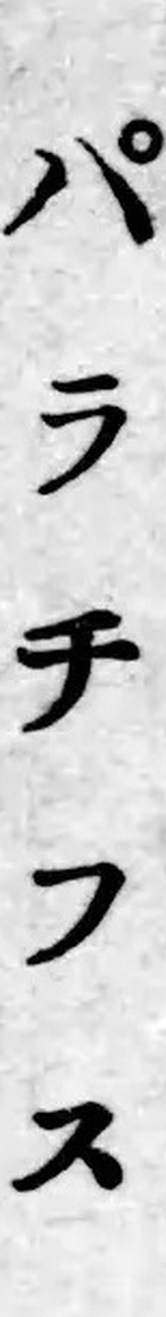パラチフス
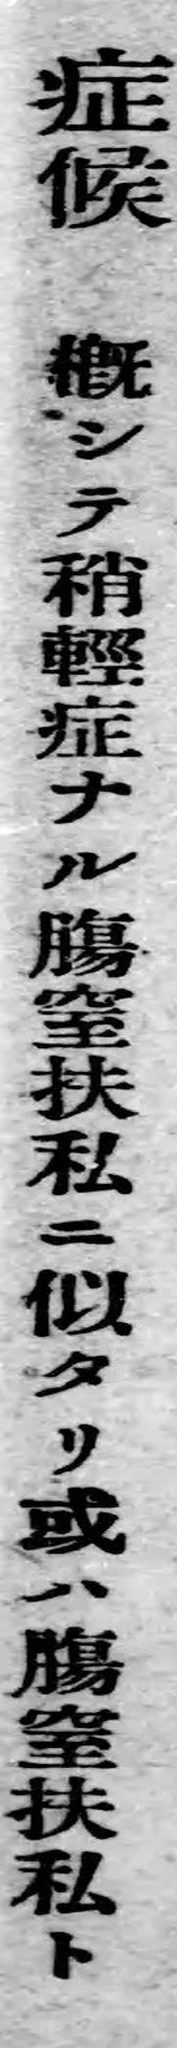症候槪シテ稍輕症ナル膓窒扶私ニ似タリ或ハ膓窒扶私ト
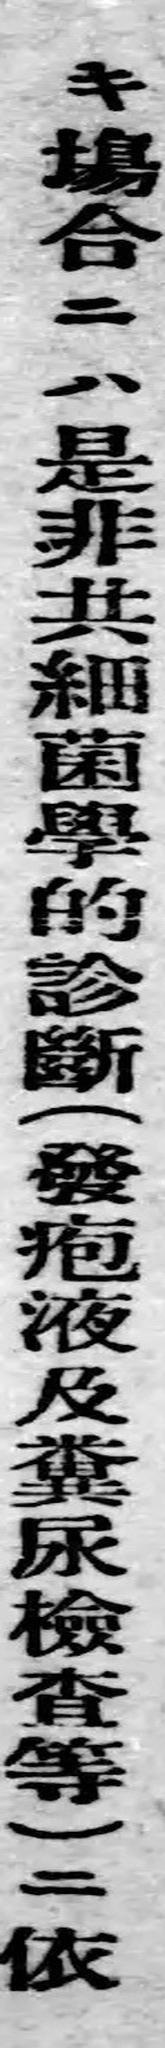キ塲合ニハ是非共細菌學的診斷(發疱液及糞尿檢査等)ニ依
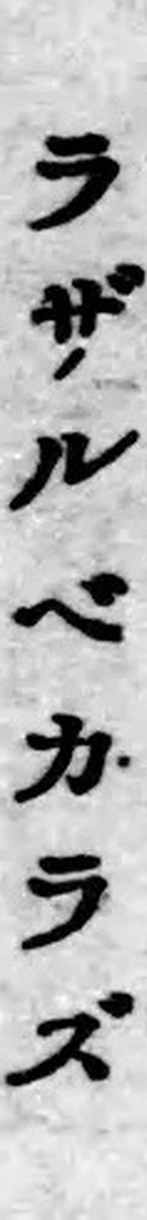ラザルベカラズ
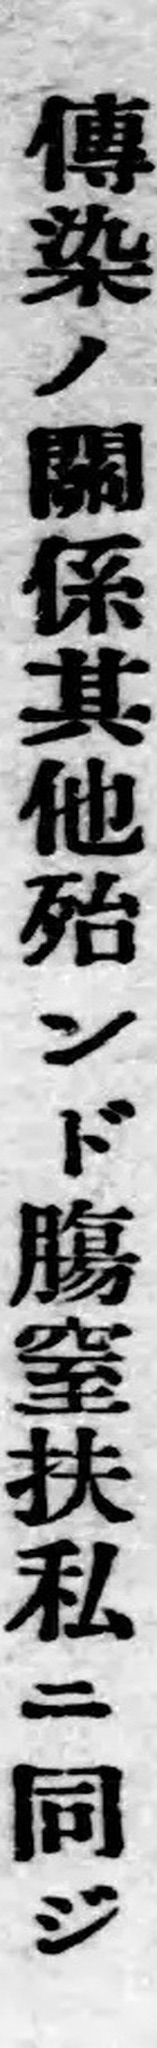傅染ノ關係其他殆ンド膓窒扶私ニ同ジ
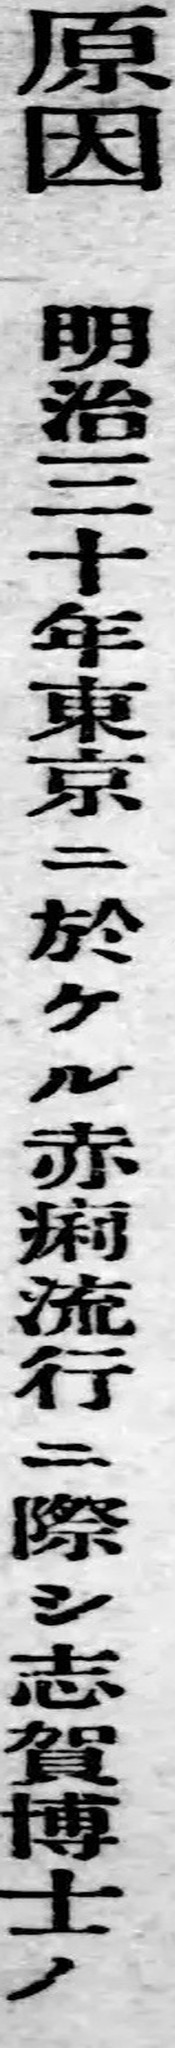原因明治三十年東京ニ於ケル赤痢流行ニ際シ志賀博士ノ
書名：袖珍防疫必携
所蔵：国立国会図書館 National Diet Library, JAPAN
